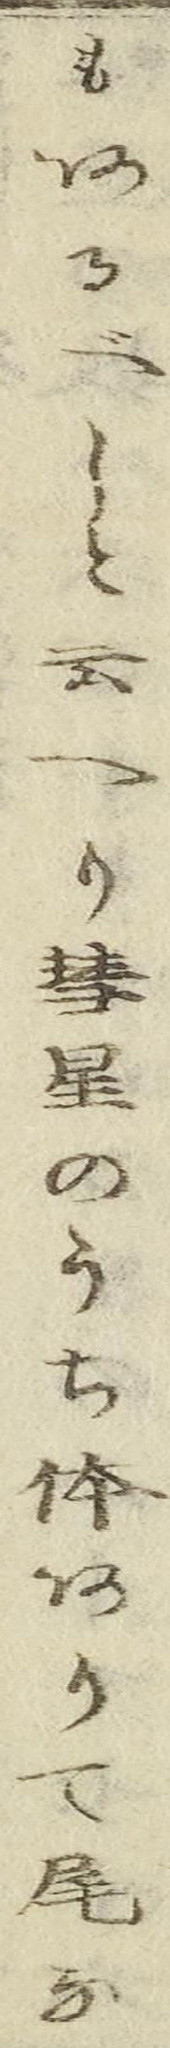もあるべしと云へり彗星のうち体ありて尾な
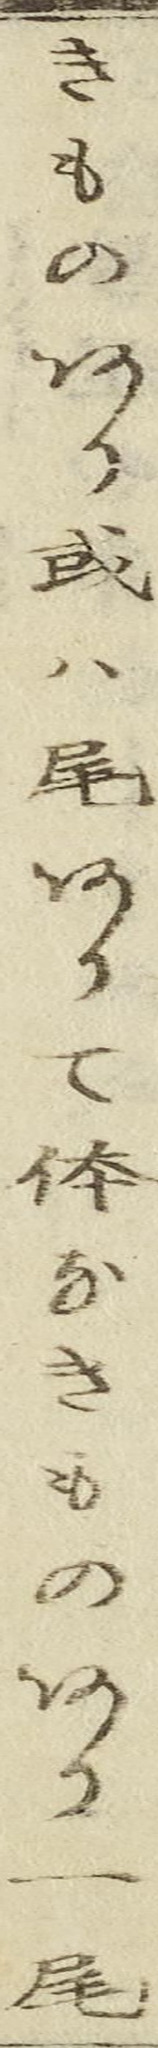きものあり或は尾ありて体なきものあり一尾
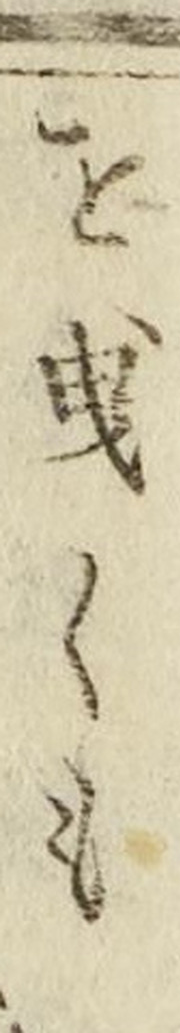を曳くも
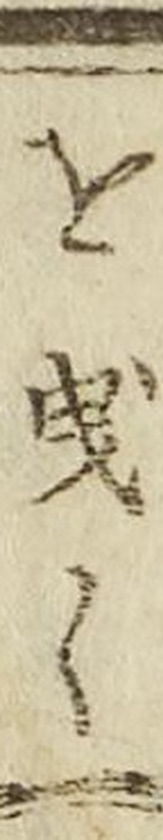を曳く

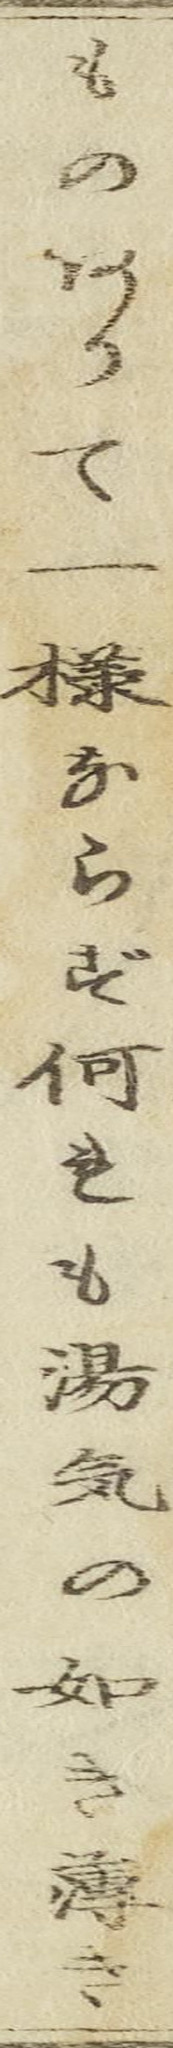ものありて一様ならず何れも湯気の如き薄き
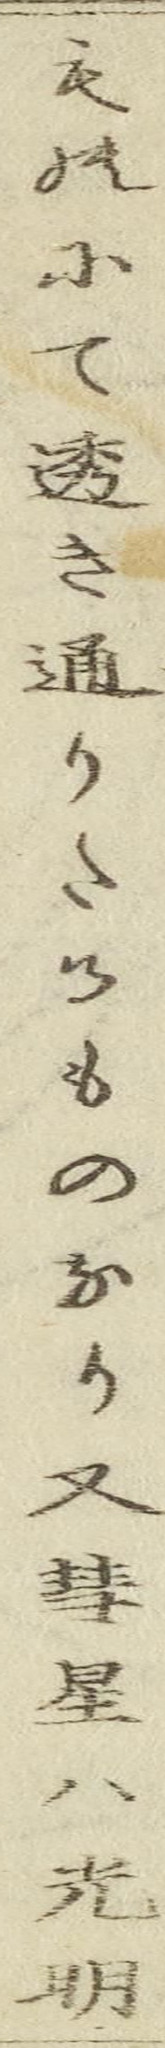ものにて透き通りたるものなり又彗星は光明
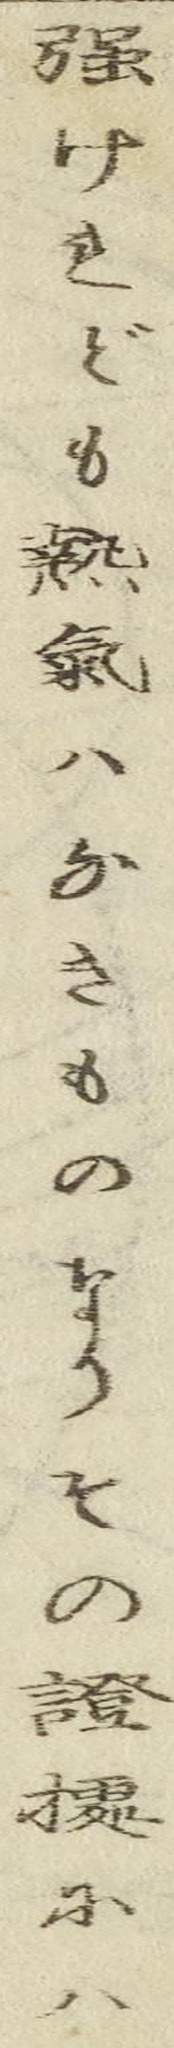強けれども熱気はなきものなりその証拠には
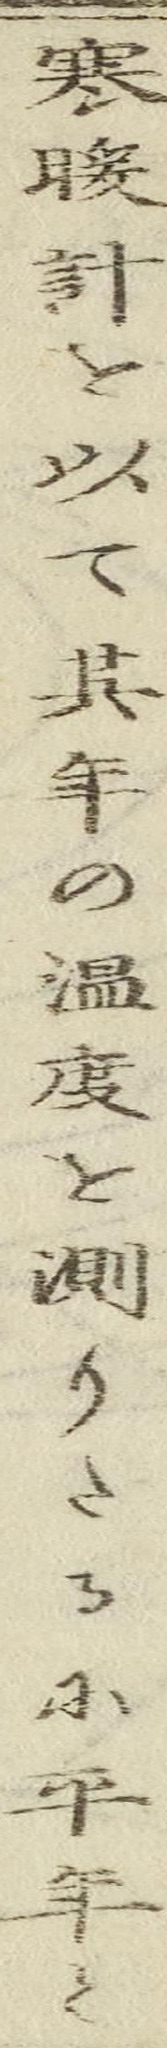寒暖計を以て其年の温度を測りたるに平年と
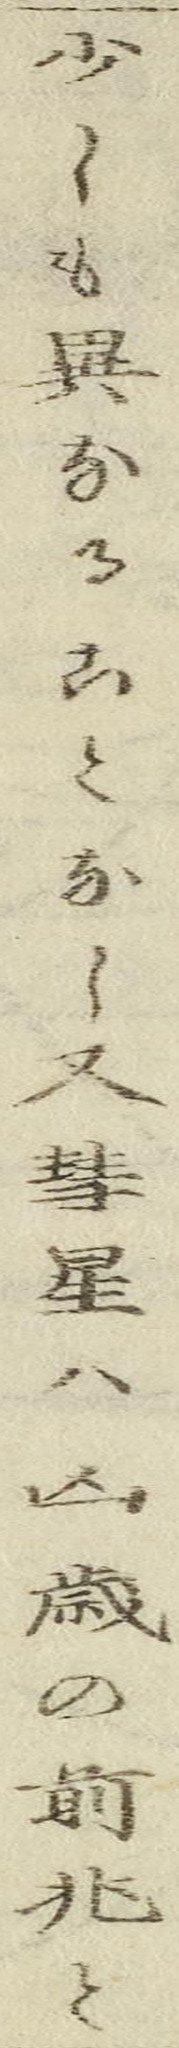少しも異なることなし又彗星は凶歳の前兆と
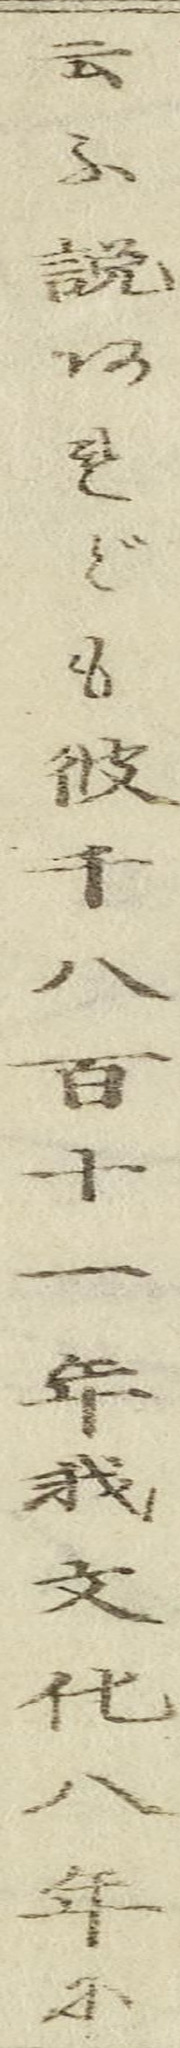云ふ説あれども彼千八百十一年我文化八年に
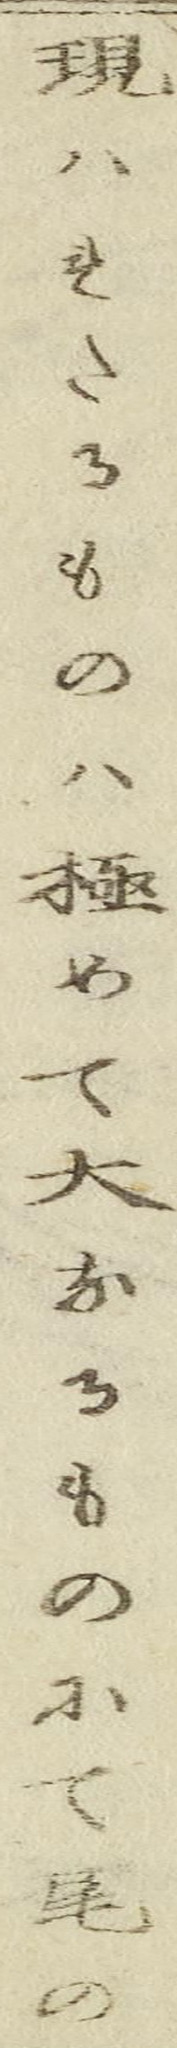現はれたるものは極めて大なるものにて尾の
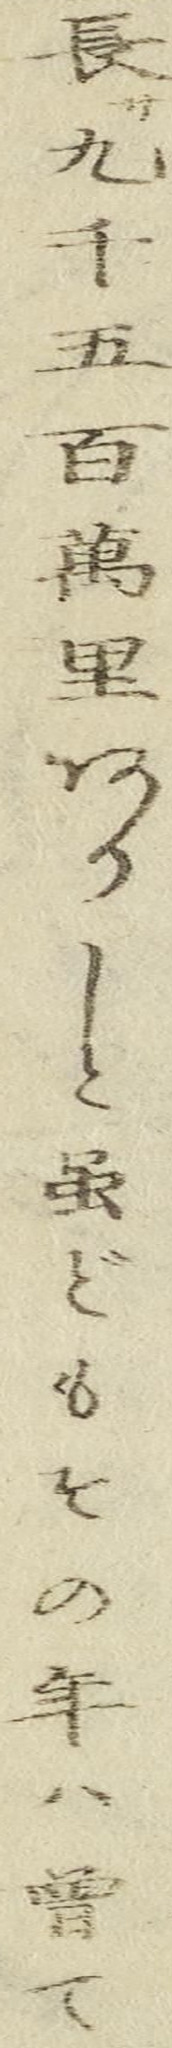長サ九千五百万里ありしと雖どもその年は曽て
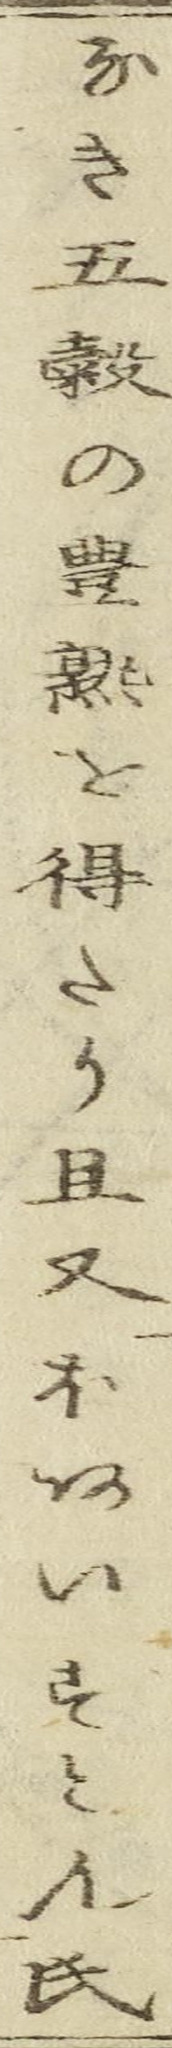なき五穀の豊熟を得たり且又「ほあいすとん」氏
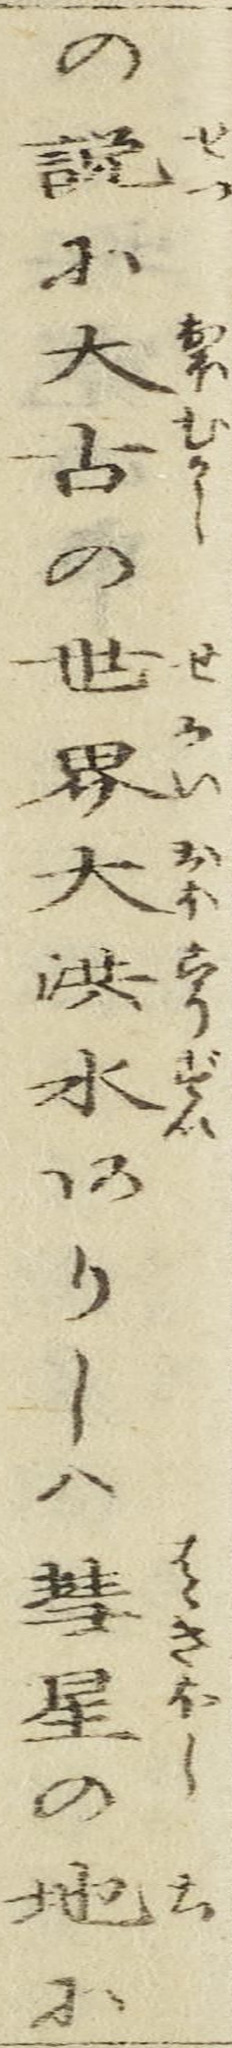の説に大古の世界大洪水ありしは彗星の地に
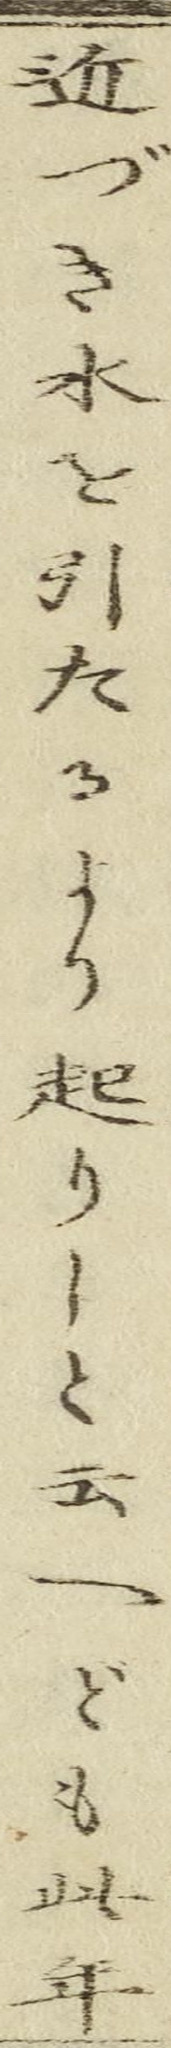近づき水を引たるより起りとし云へども此年
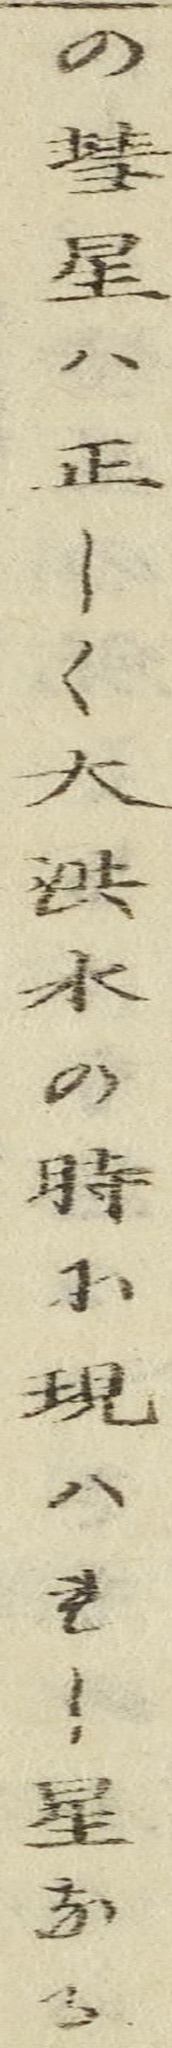の彗星は正しく大洪水の時に現はれし星なる
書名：天変地異
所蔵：東京大学地震研究所図書室 Earthquake Research Institute Library, The University of Tokyo, JAPAN
